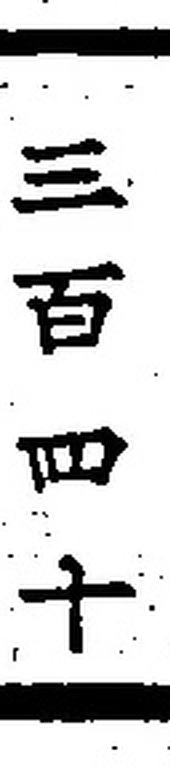三百四十
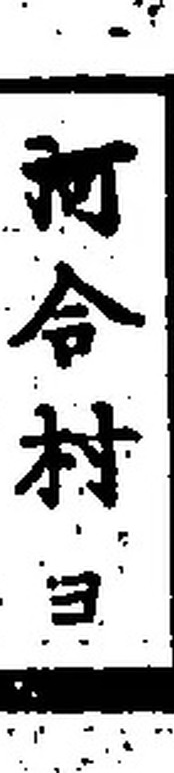河合村ヨ
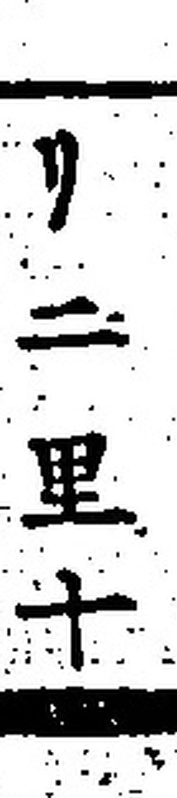リ二里十
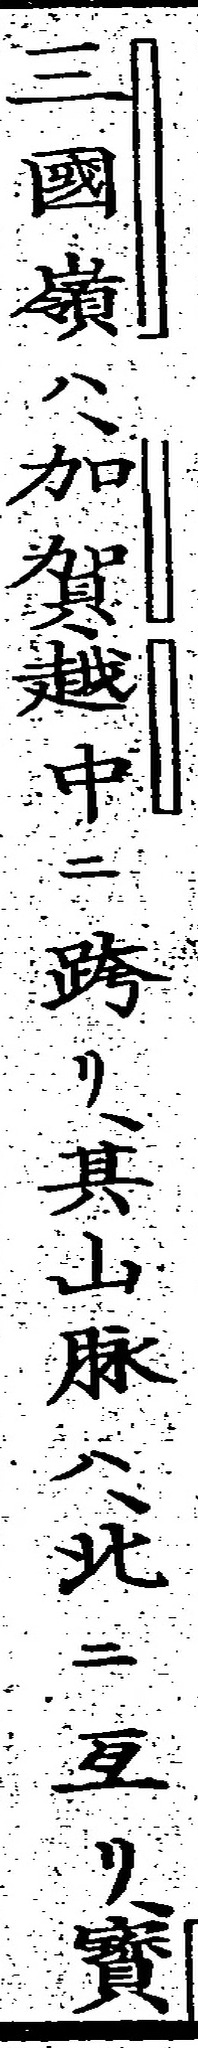三国嶺ハ、加賀・越中ニ跨リ、其山脈ハ、北ニ亙リ、宝
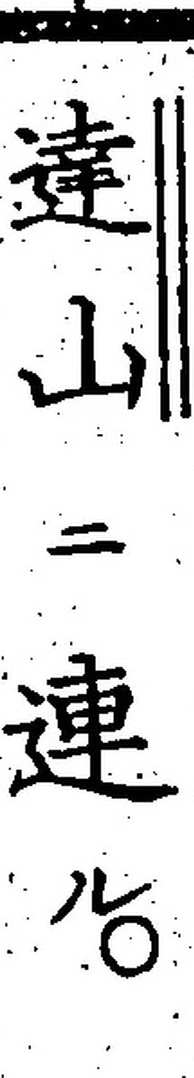達山ニ連ル。
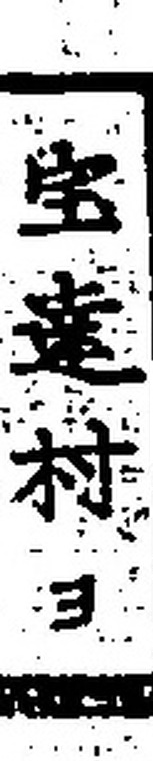宝達村ヨ
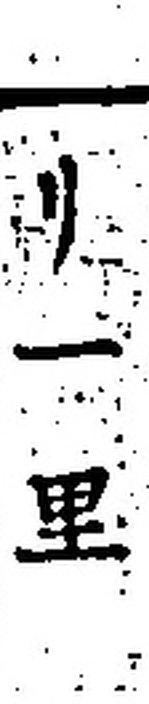リ一里
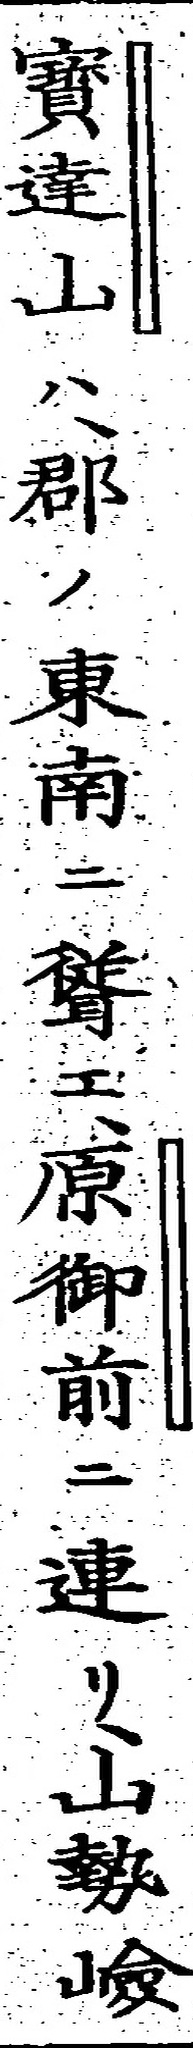宝達山ハ、郡ノ東南ニ聳エ、原御前ニ連リ、山勢嶮
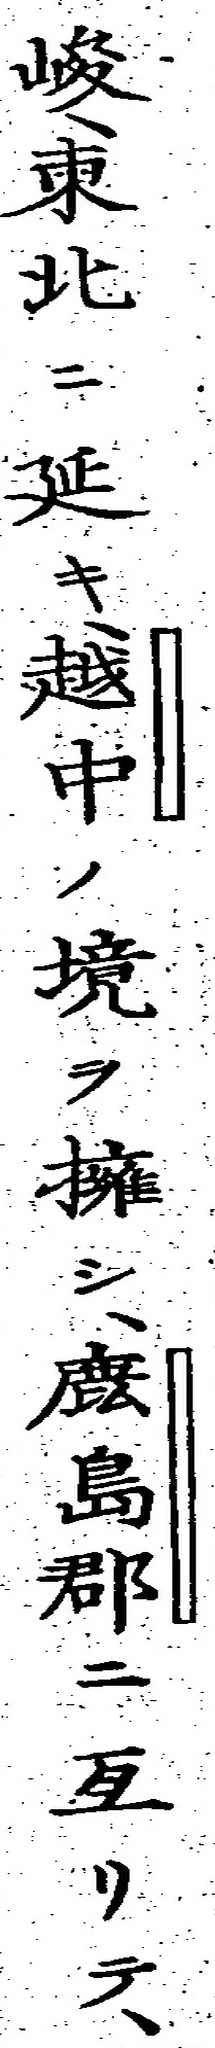峻、東北ニ延キ、越中ノ境ヲ擁シ、鹿島郡ニ亙リテ、
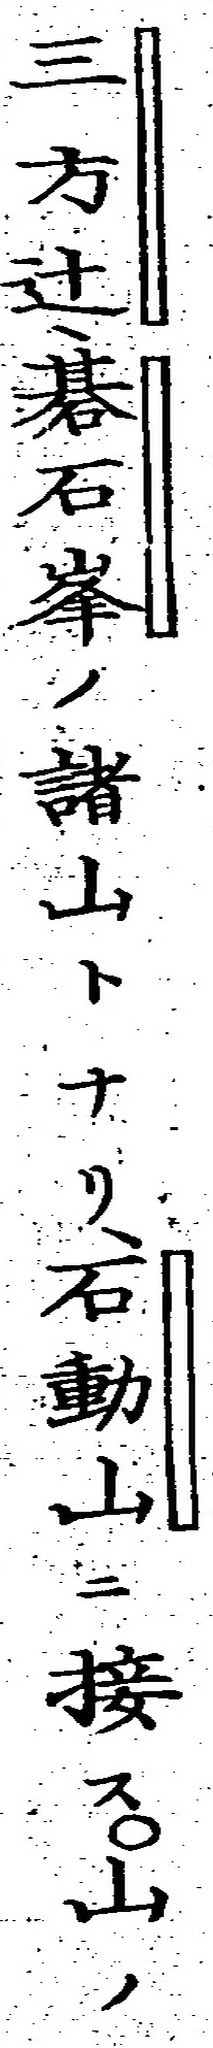三方辻・碁石峯ノ諸山トナリ、石動山ニ接ス。山ノ
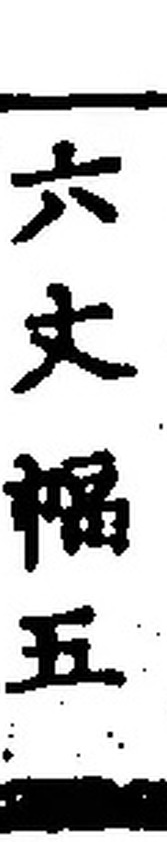六丈幅五
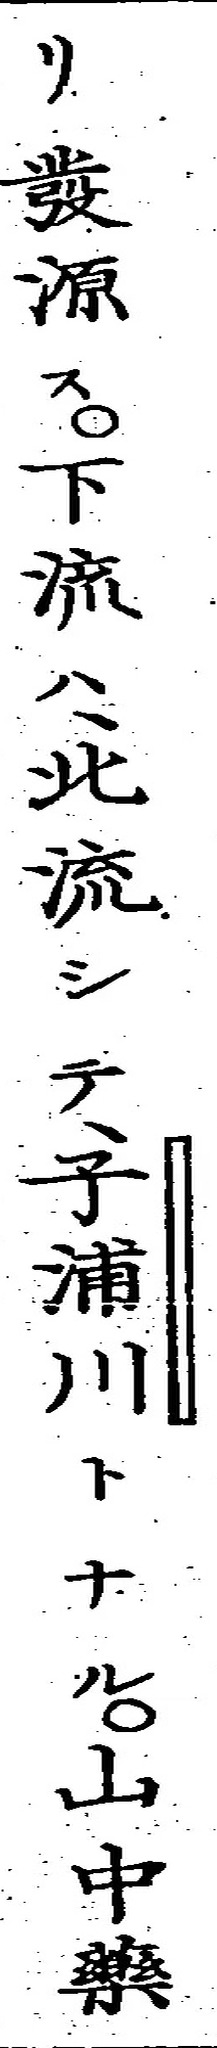リ発源ス。下流ハ、北流シテ、子浦川トナル。山中薬

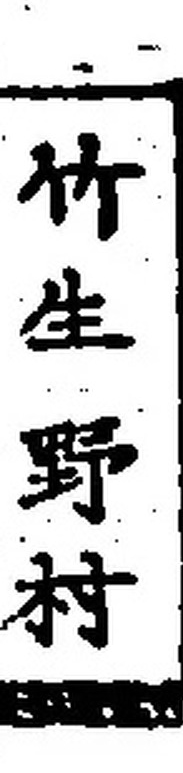竹生野村
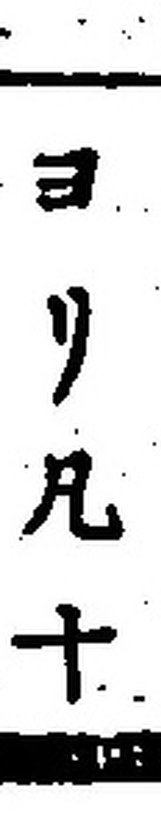ヨリ凡十
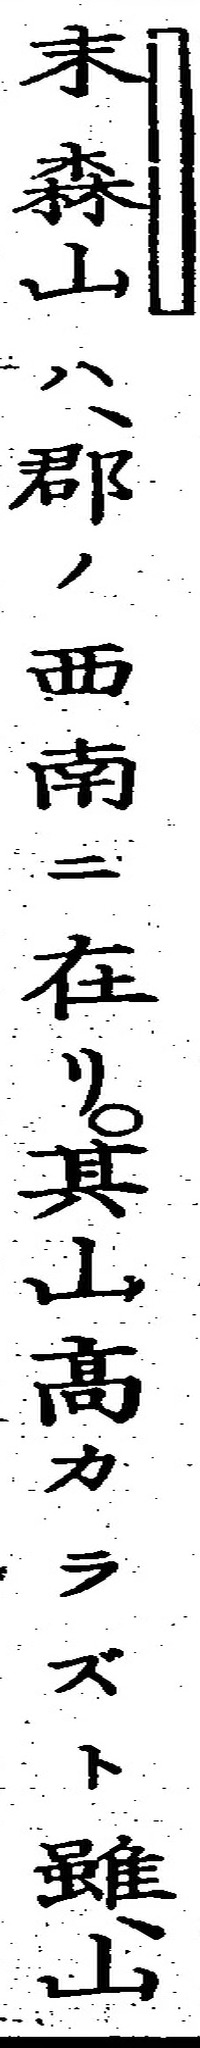末森山ハ、郡ノ西南ニ在リ。其山高カラズト雖、山
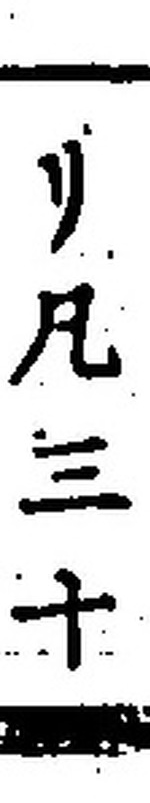リ凡三十
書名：能登地誌略
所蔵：国立国会図書館 National Diet Library, JAPAN
